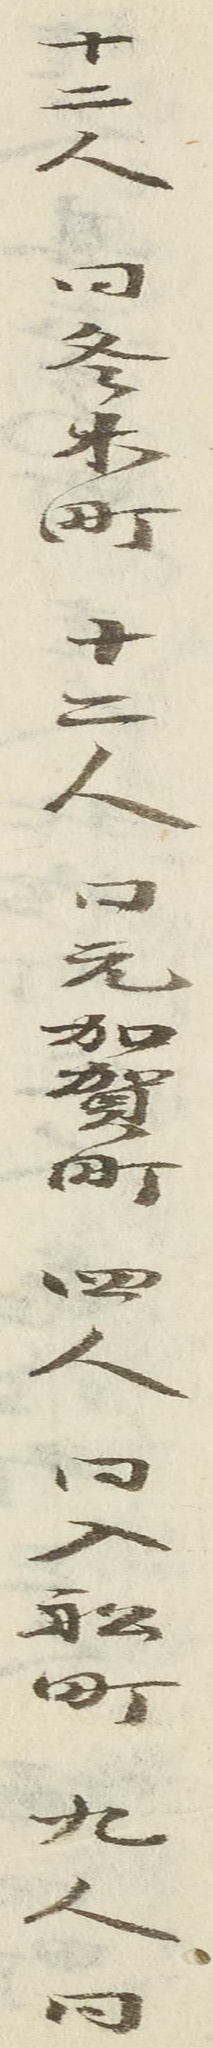十二人同冬木町十二人同元加賀町四人同入船町九人同
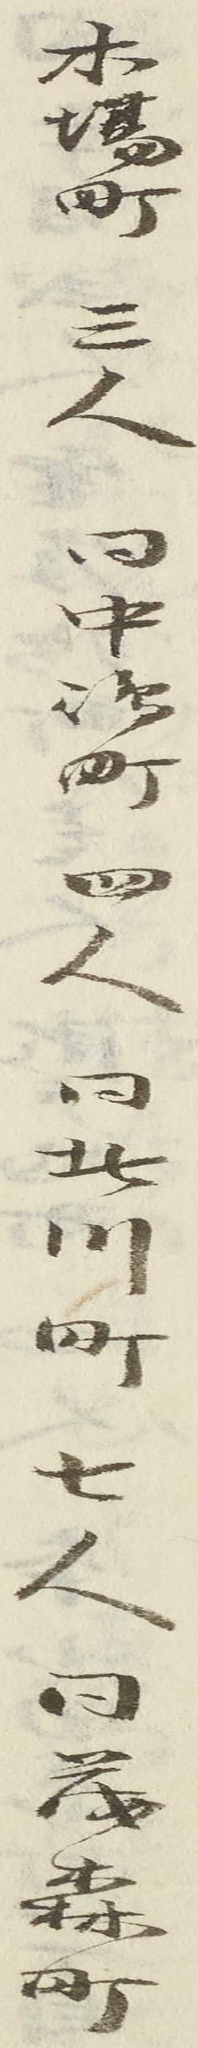木場町三人同中嶋町四人同北川町七人同茂森町
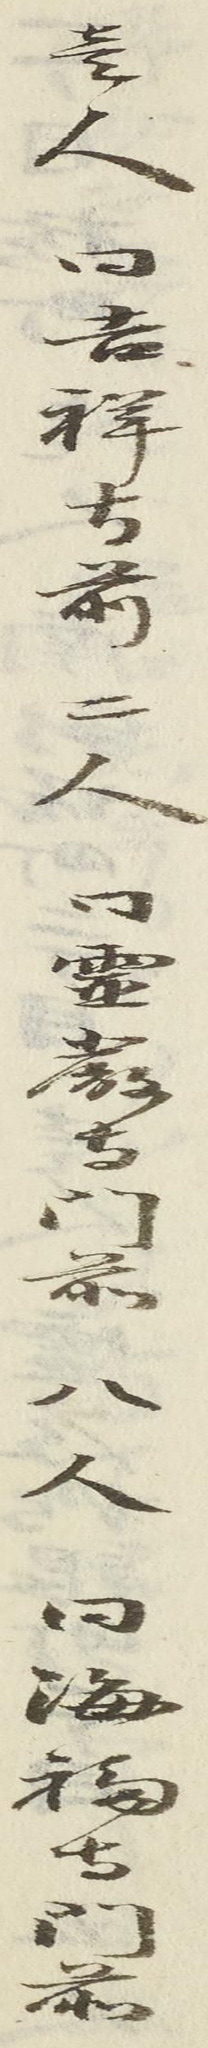壱人同吉祥寺前二人同霊岸寺門前八人同海福寺門前
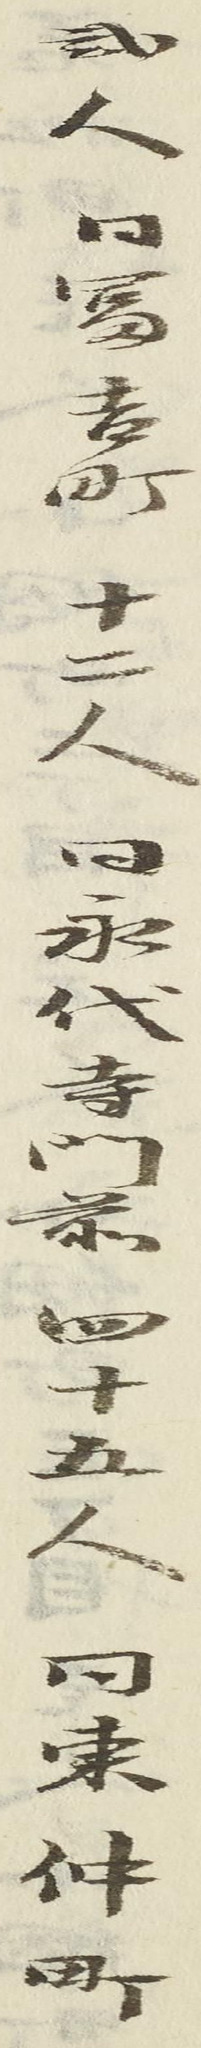弐人同富吉町十二人同永代寺門前四十五人同東仲町
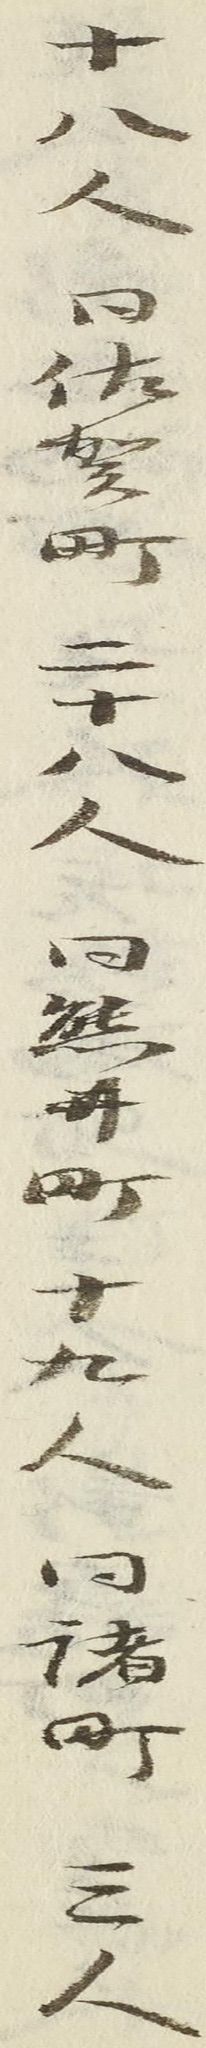十八人同佐賀町二十八人同熊井町十九人同諸町三人
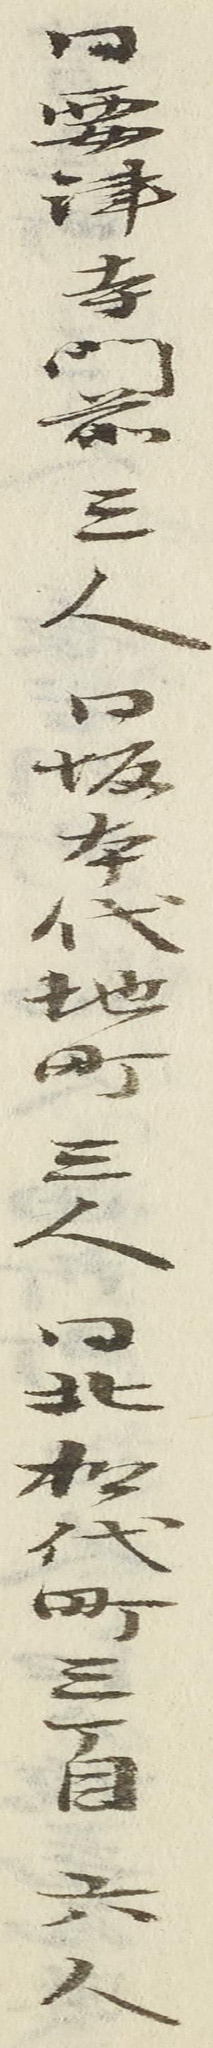同要津寺門前三人同坂本代地町三人同北松代町三丁目六人
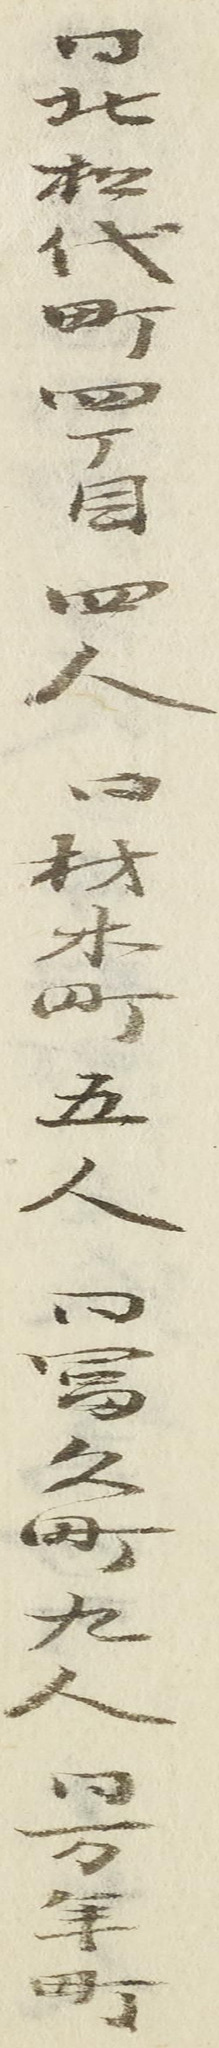同北松代町四丁目四人同材木町五人同富久町九人同万年町
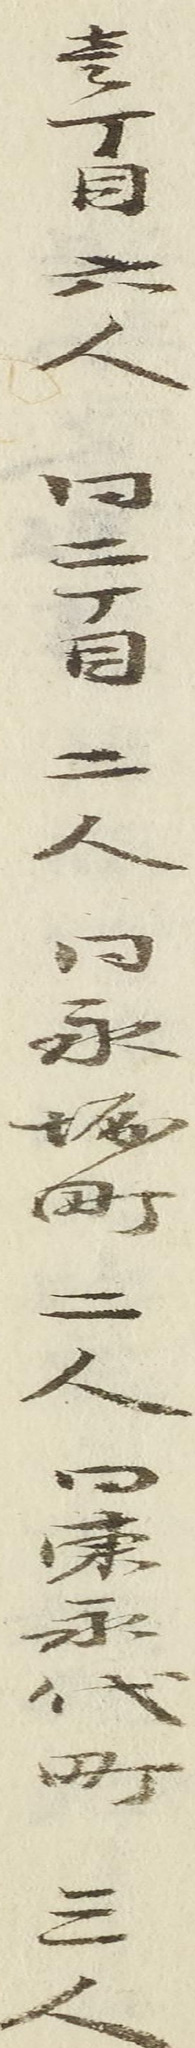壱丁目六人同二丁目二人同永堀町二人同東永代町三人
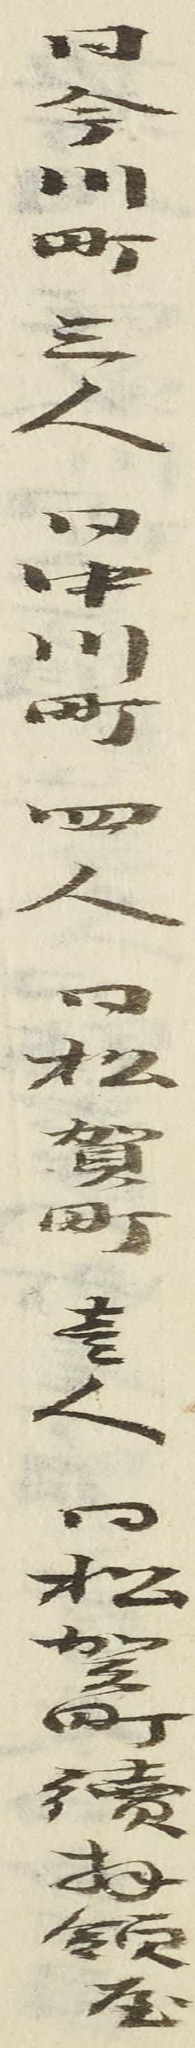同今川町人同中川町四人同松賀町壱人同松賀町続拝領屋
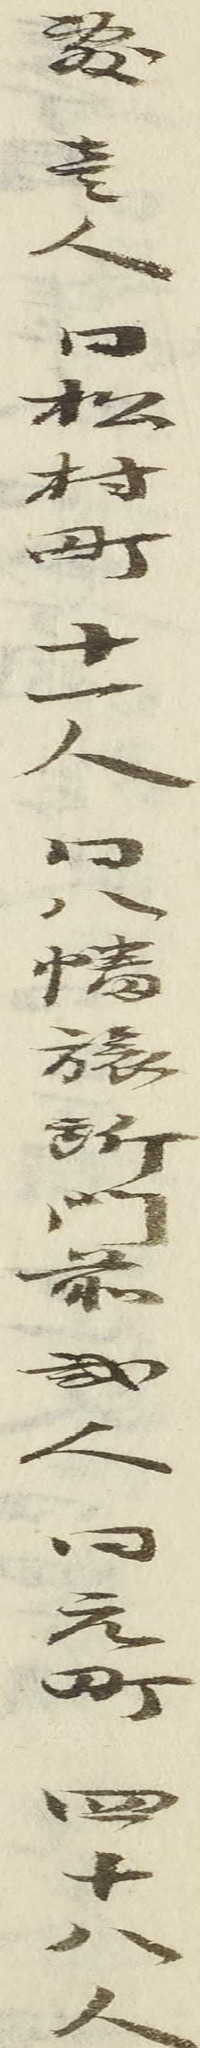敷壱人同松村町十一人同八幡旅所門前弐人同元町四十八人
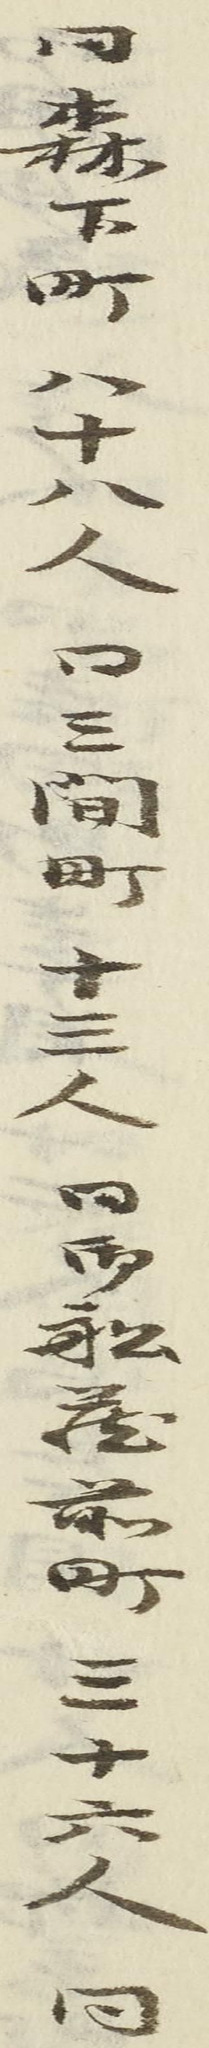同森下町八十八人同三間町十三人同御船蔵前町三十六人同
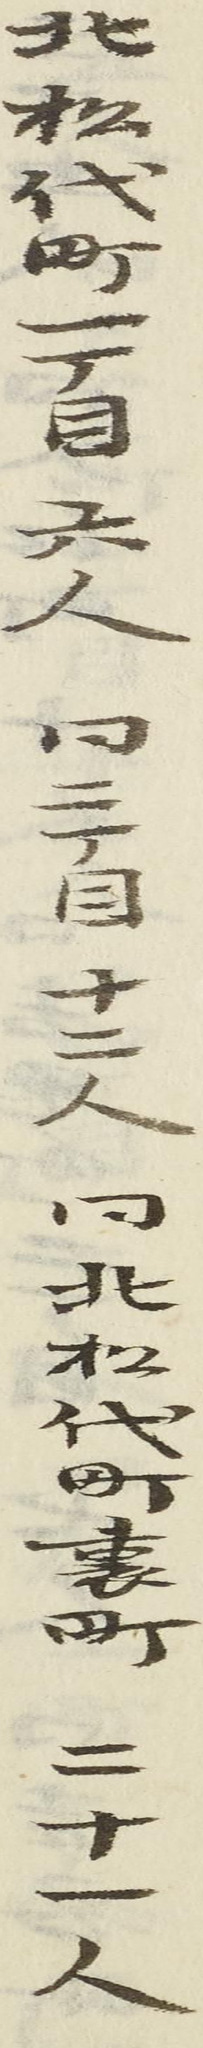北松代町一丁目六人同二丁目十二人同北松代町裏町二十一人
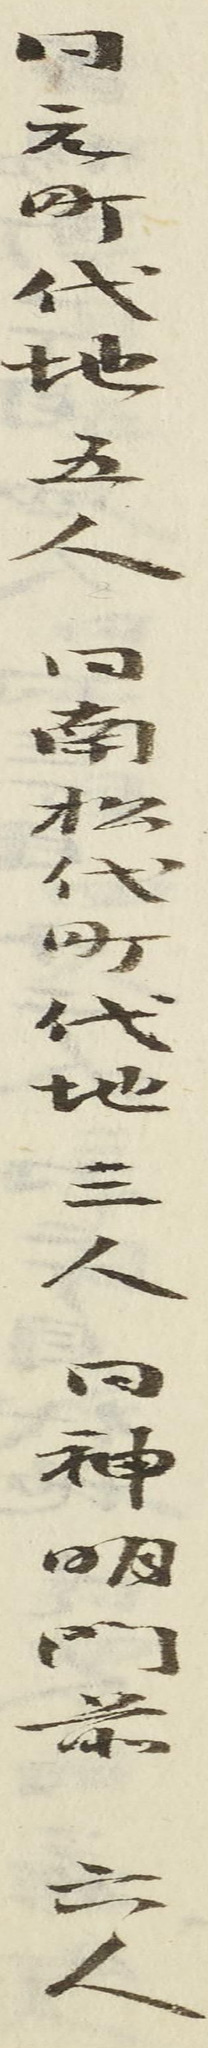同元町代地五人同南松代町代地三人同神明門前六人
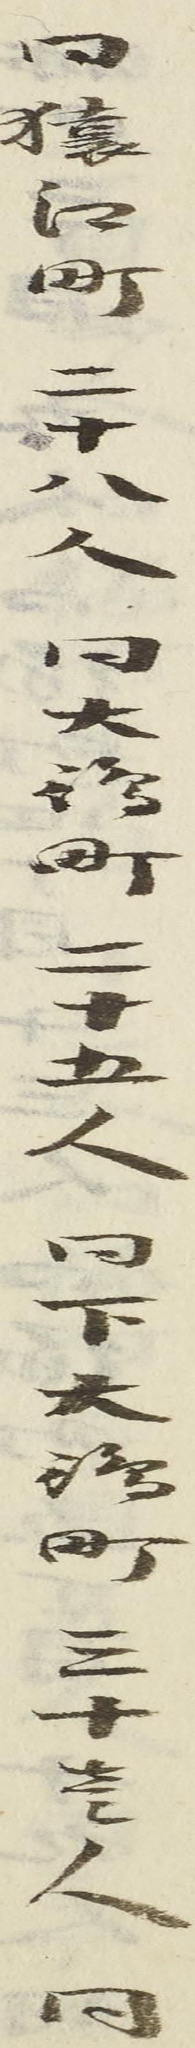同猿江町二十八人同大嶋町二十五人同下大嶋町三十壱人同
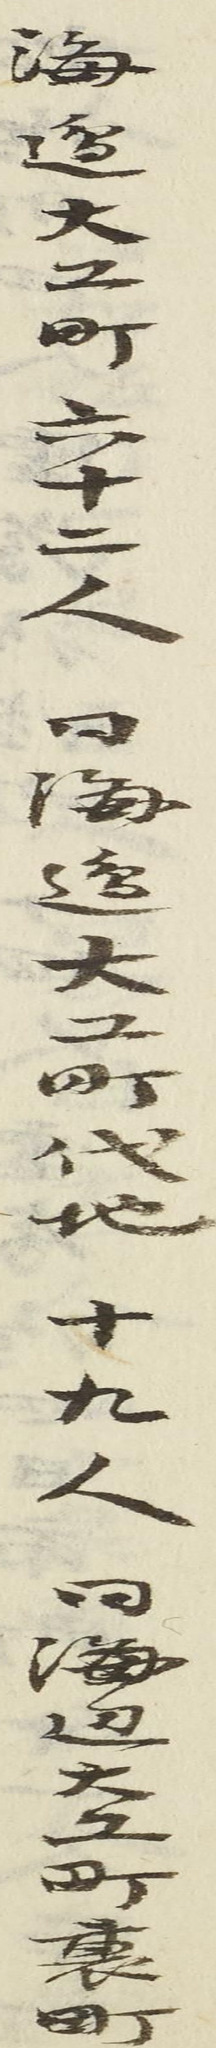海辺大工町六十二人同海辺大町代地十九人同海辺大工町裏町
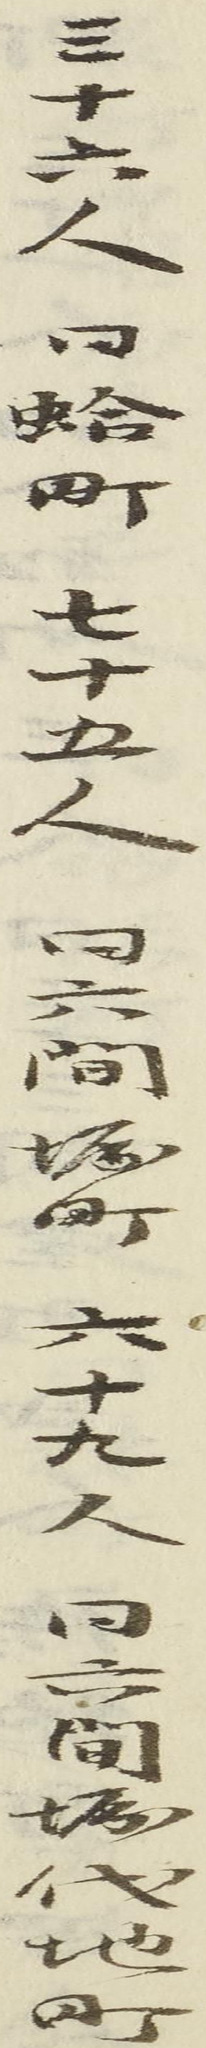三十六人同蛤町七十五人同六間堀町六十九人同六間堀代地町
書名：那為の後見艸　全
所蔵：東京大学地震研究所図書室 Earthquake Research Institute Library, The University of Tokyo, JAPAN
